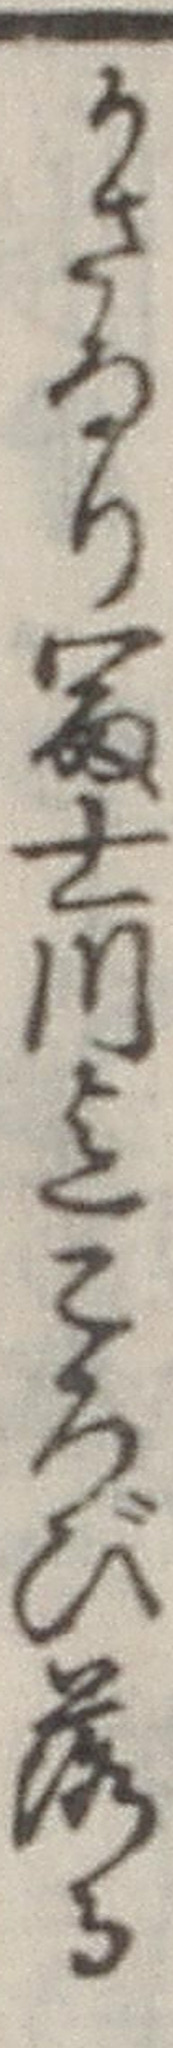かさなり富士川迄ころび落る
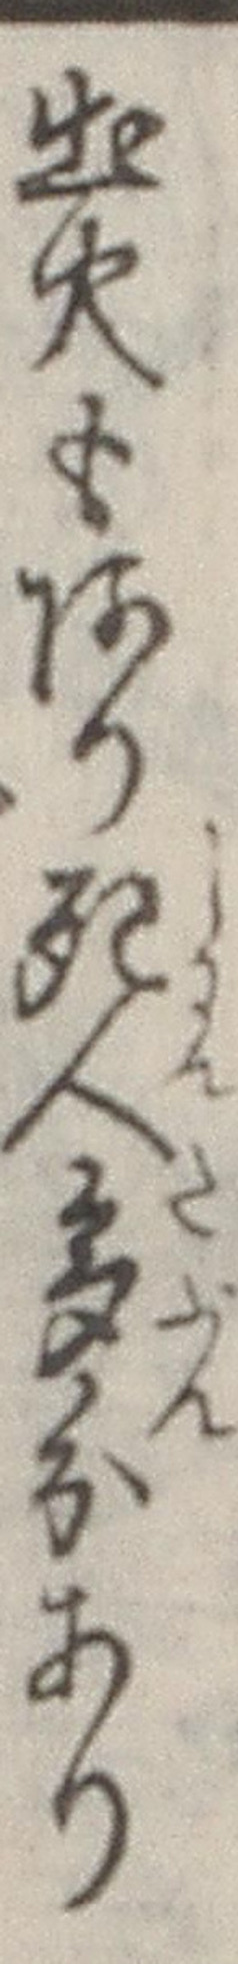出火もあり死人多分あり
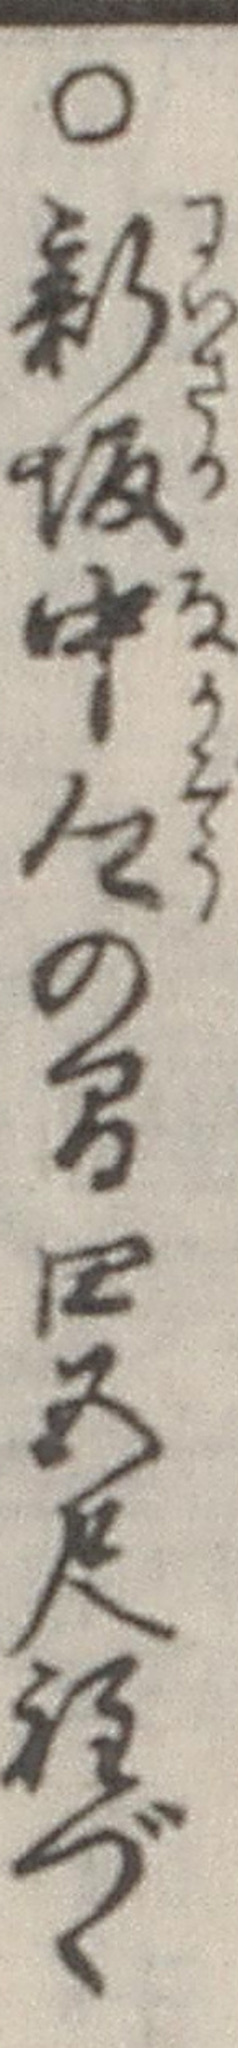○新坂仲郷の間四五尺程づゝ
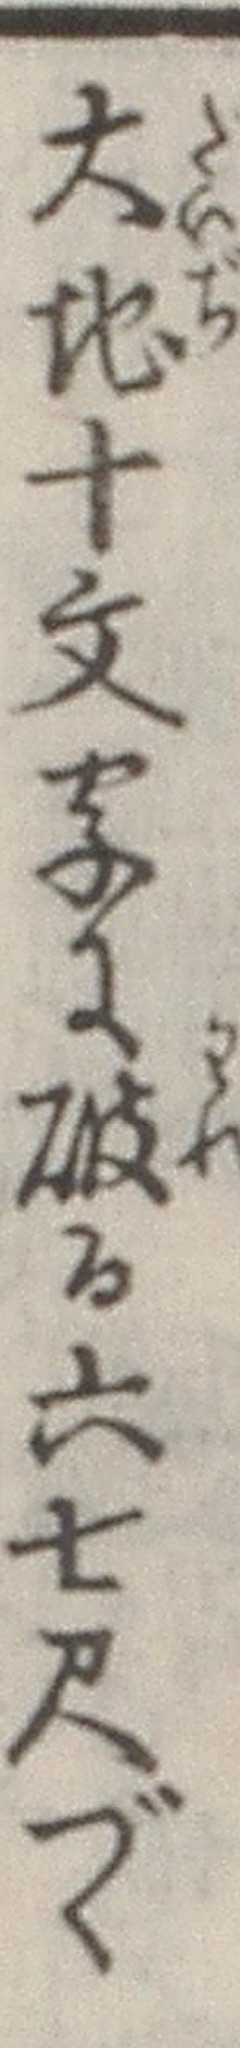大地十文字に破る六七尺づゝ
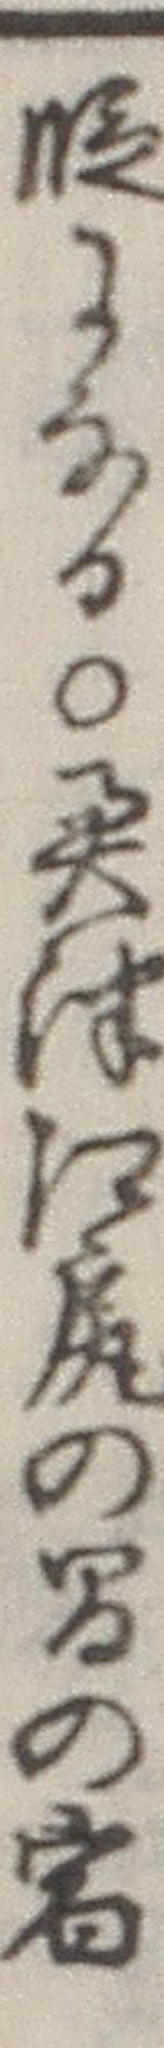段になる○興津江尻の間の宿
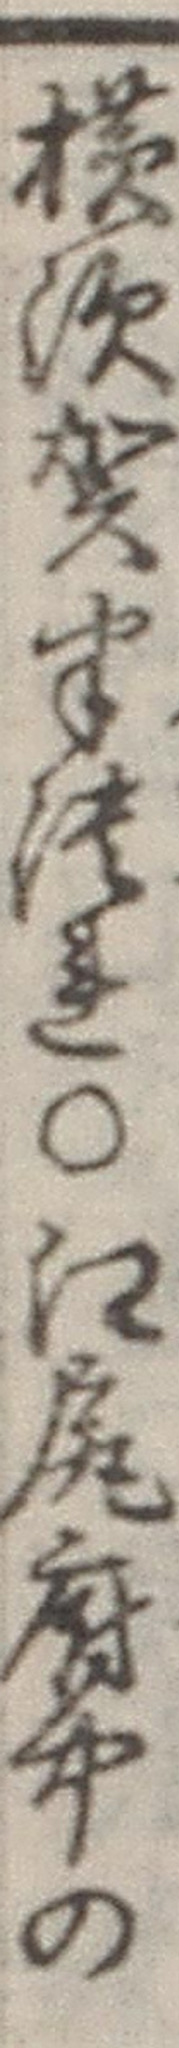横須賀半潰れ○江尻府中の
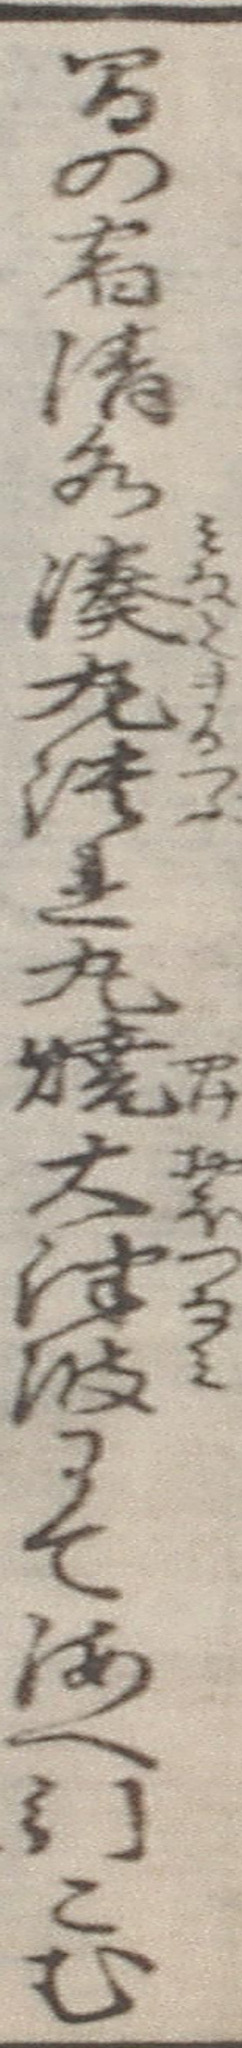間の宿清水湊丸潰れ丸焼大津波にて海へ引こむ
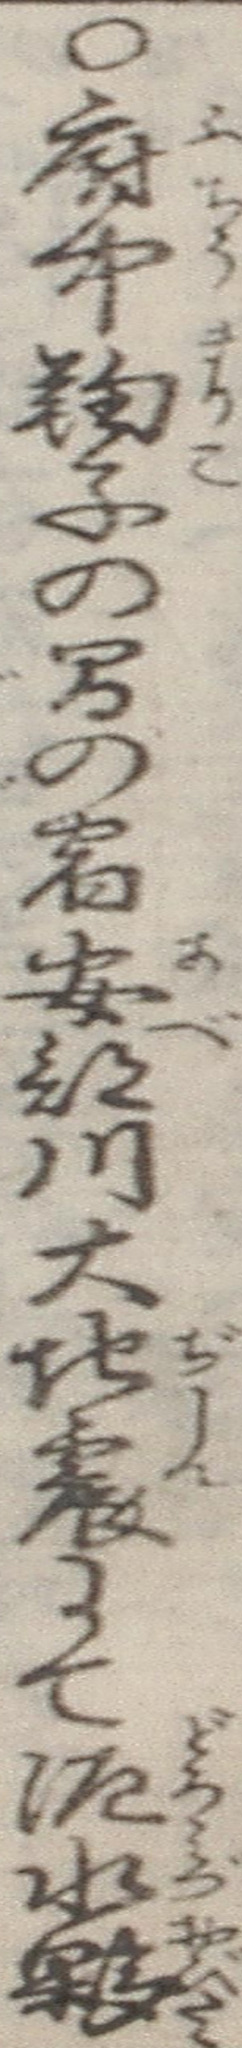○府中鞠子の間の宿安部川大地震にて泥水夥
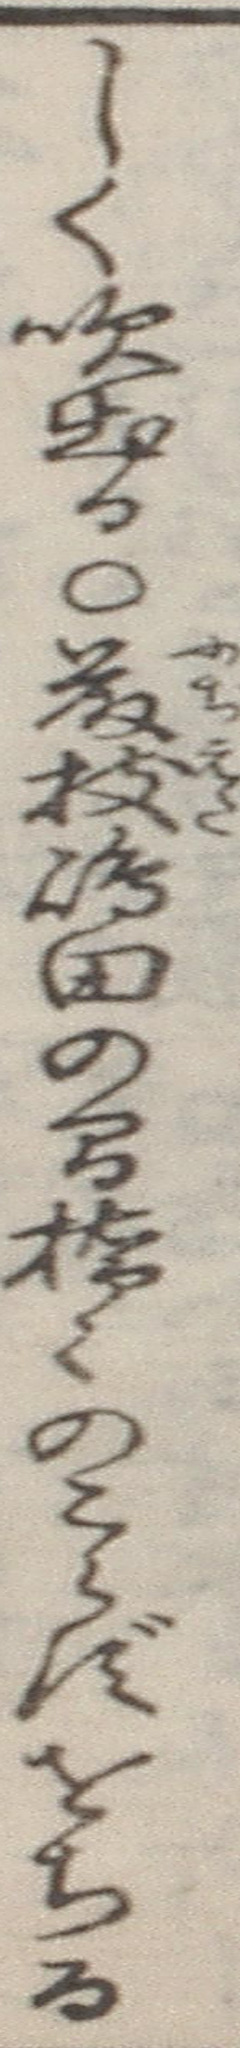しく吹出る○藤枝嶋田の間橋々のこらずをちる
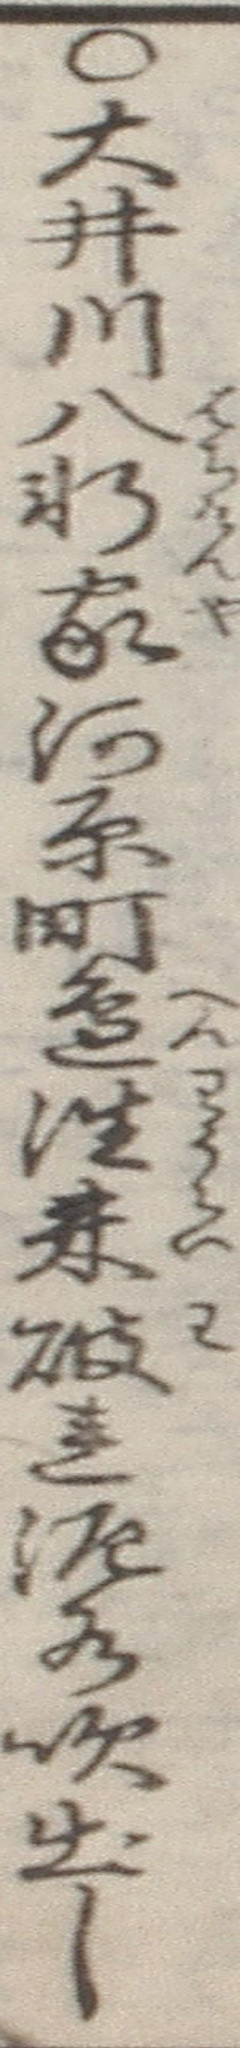○大井川八軒家河原町辺往来破れ泥水吹出し
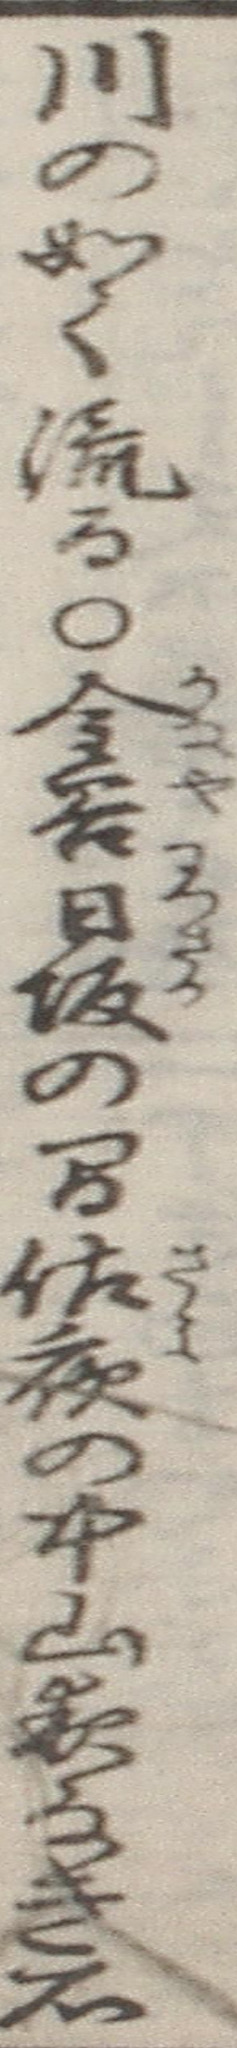川の如く流る○金谷日坂の間佐夜の中山夜なき石
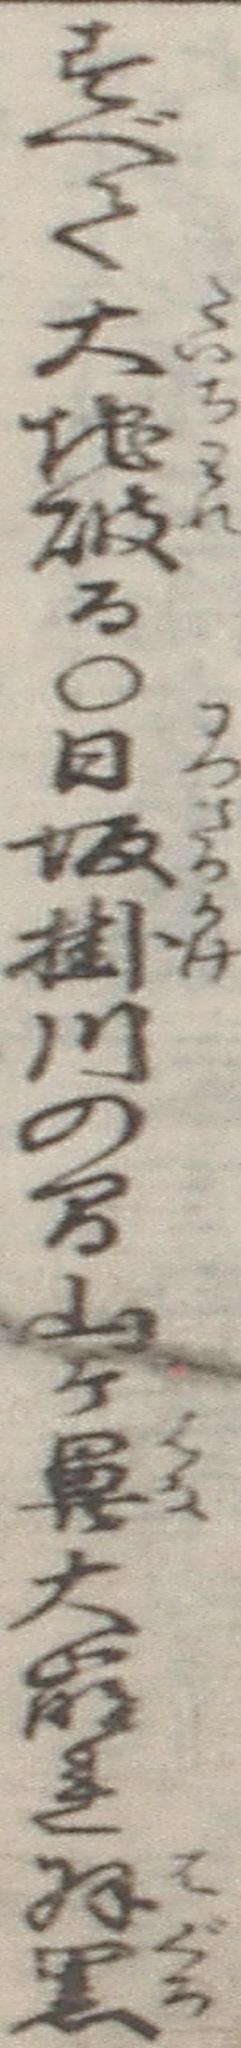すべて大地破る○日坂掛川の間山ヶ鼻大崩れ羽黒
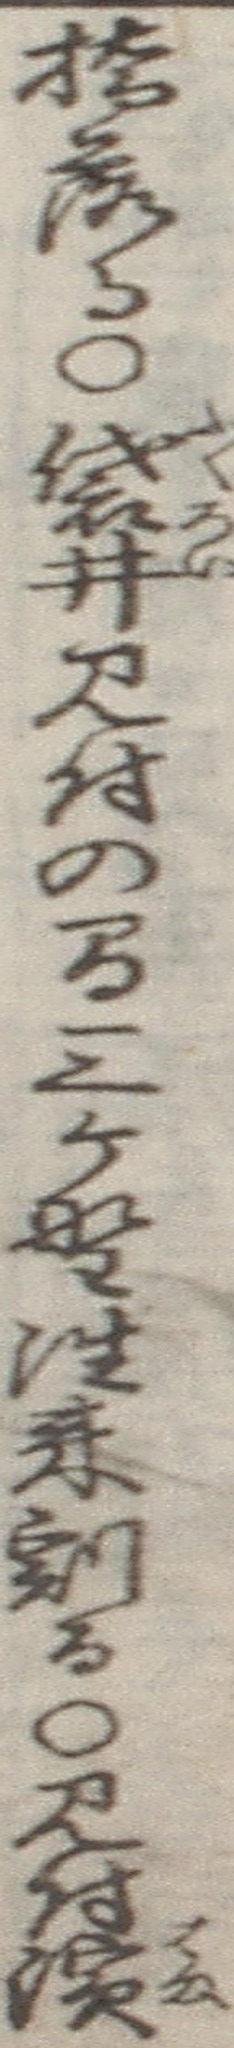橋落る○袋井見付の間三ヶ野往来割る○見付浜
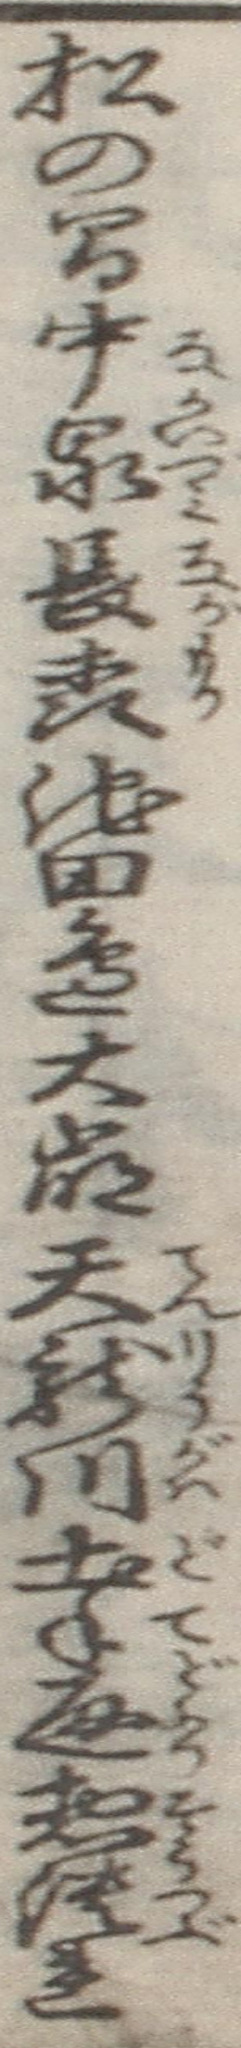松の間中泉長森池田辺大崩天龍川土手通惣潰れ
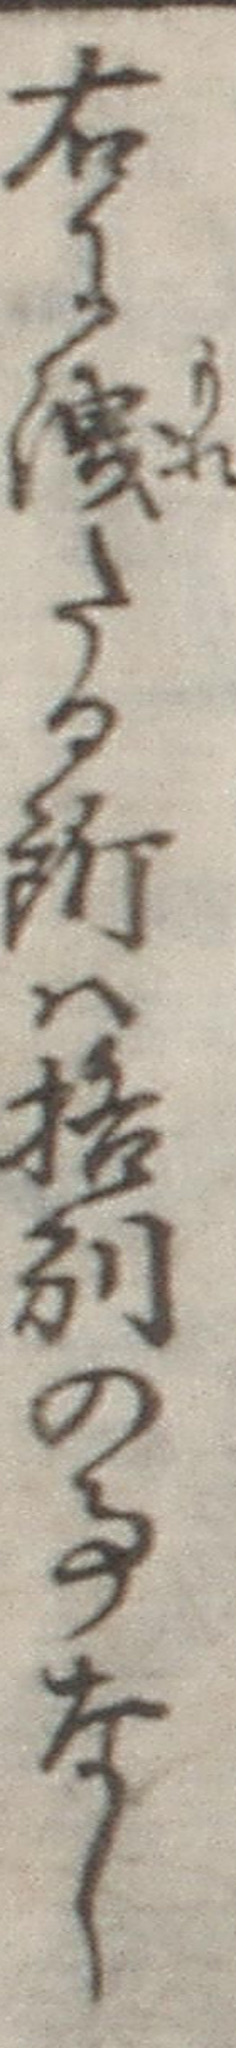右に洩たる所は格別の事なし

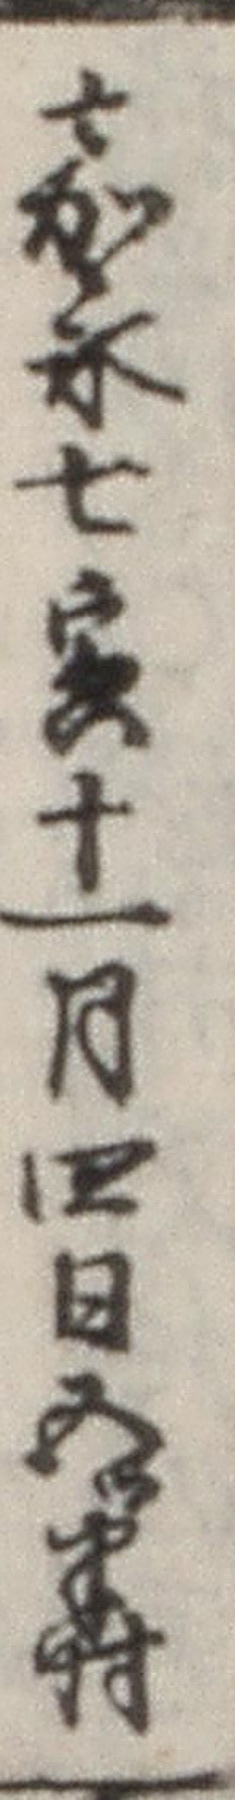嘉永七寅十一月四日五ツ半時
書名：諸國大地震年代記　末代噺種
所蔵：東京大学地震研究所図書室 Earthquake Research Institute Library, The University of Tokyo, JAPAN
